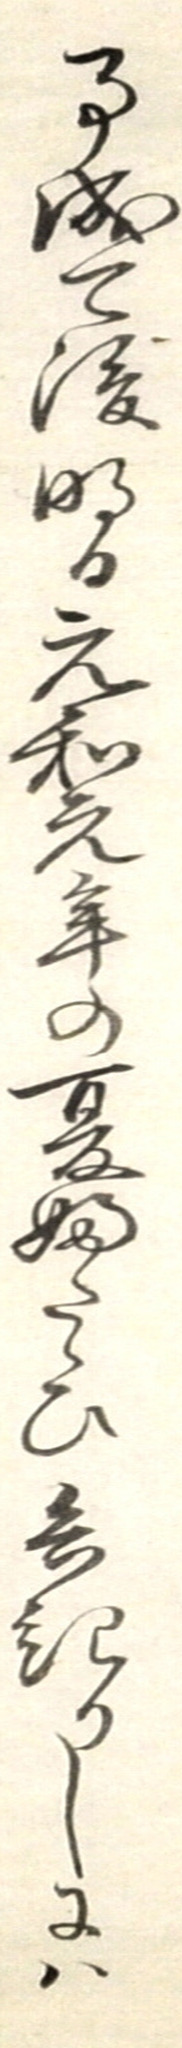事成て後明る元和元年の夏ふたゝひ兵起りしには
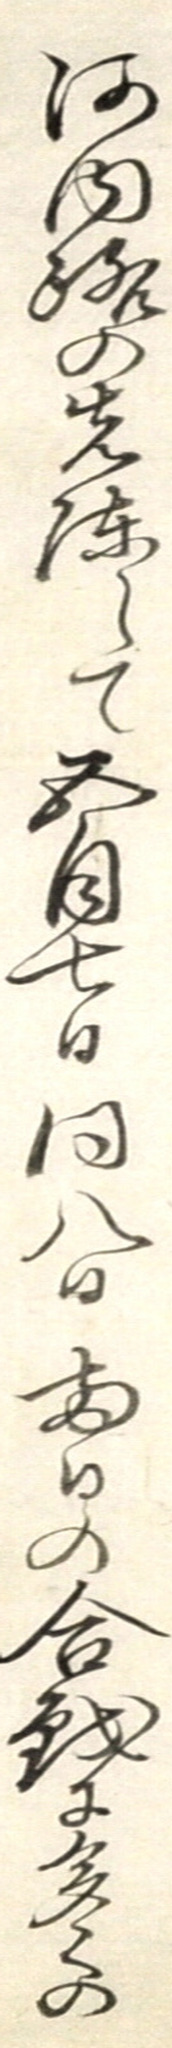河内路の先陣して五月七日同八日両日の合戦に多くの
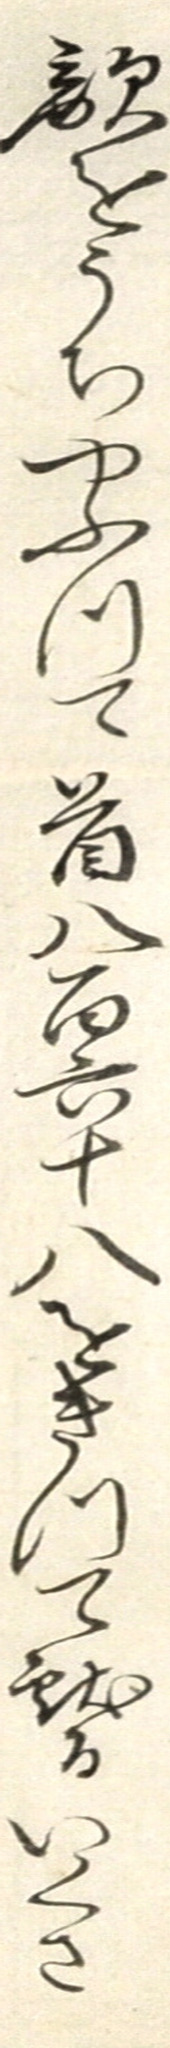敵をうちやふつて首八百六十八をきつて献るいくさ
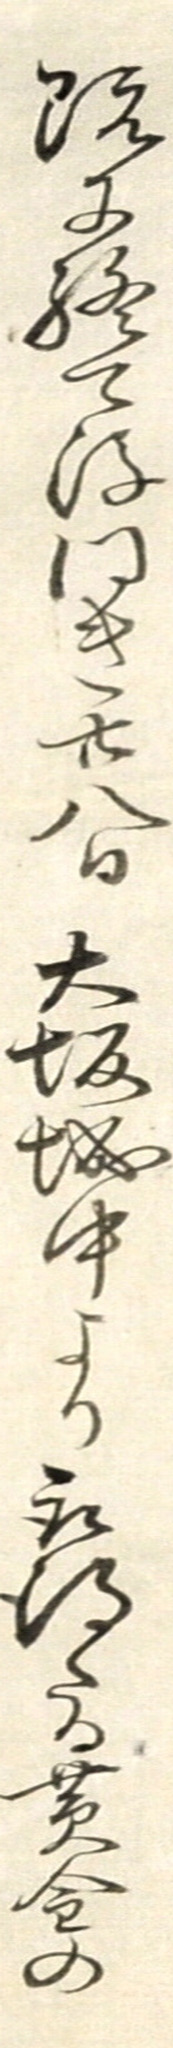既に終て後同き廿八日大坂城中より取得たる黄金の
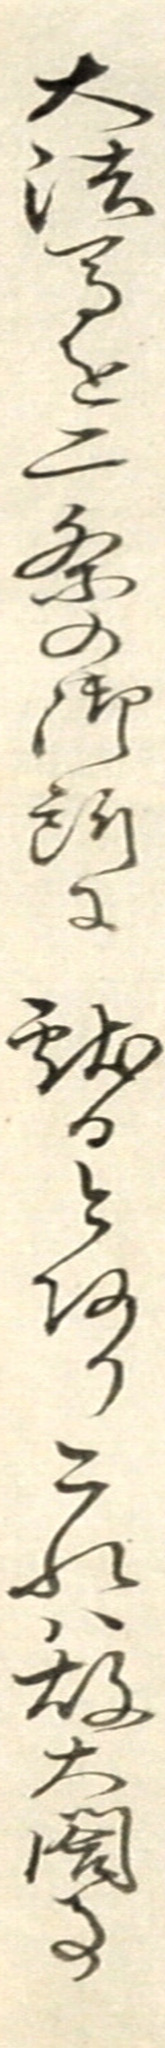大法馬を二条の御所に献るとありこれは故大閤事
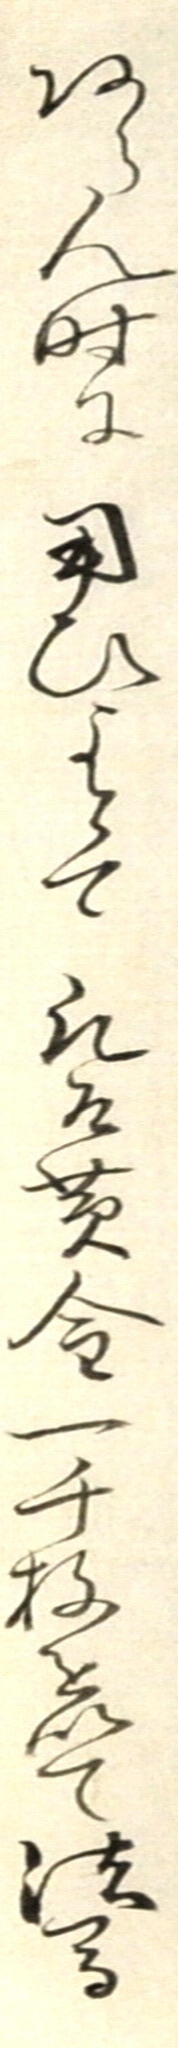あらん時に用ひよとて凡そ黄金一千枚を以て法馬

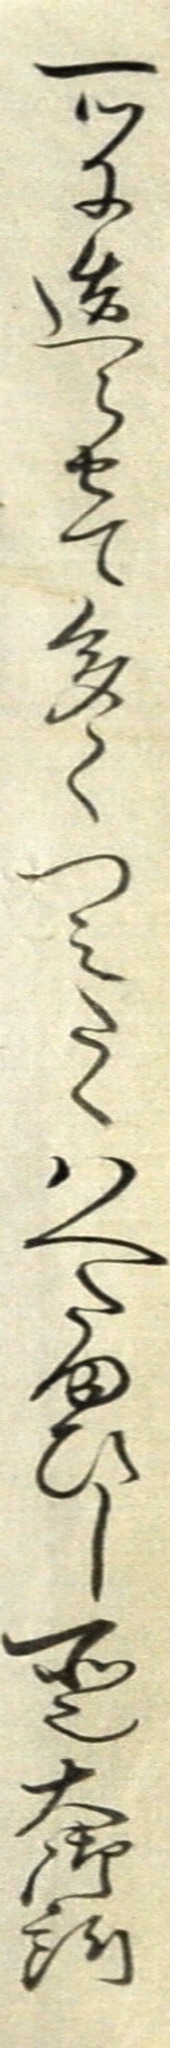一ツに造らせて多くつみたくはへたまひし所也大御所
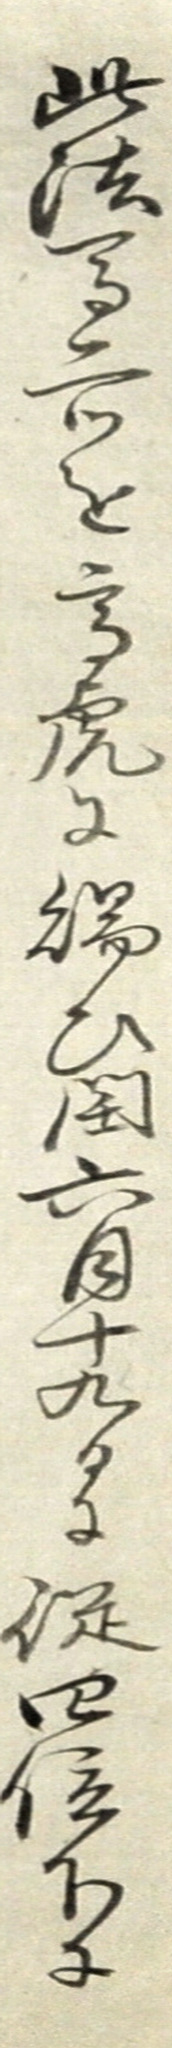此法馬二ツを高虎に賜ひ閏六月十九日に従四位下に
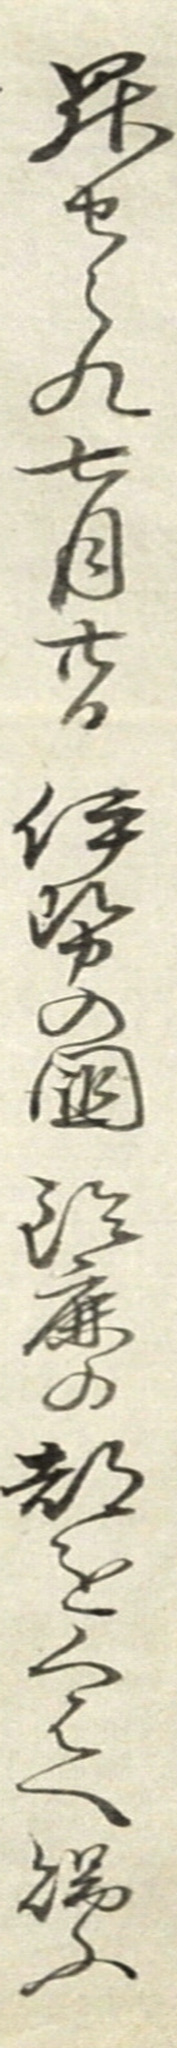昇せられ七月廿日伊勢の国鈴鹿の郡をくはへ賜ふ
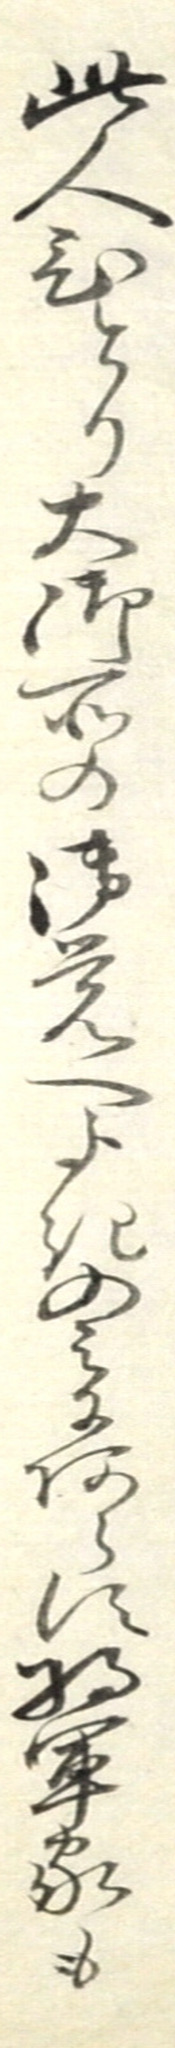此人ひとり大御所の御覚へよきのみにあらす将軍家も
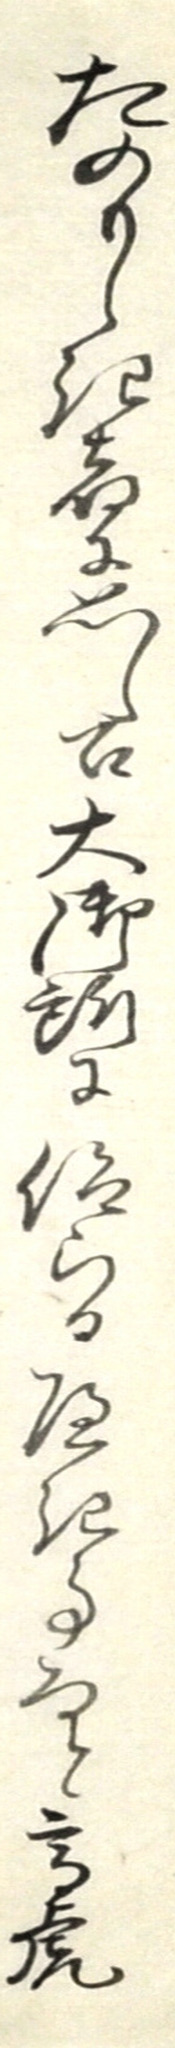たのもしき者に思し召大御所に仰らるへき事なと高虎
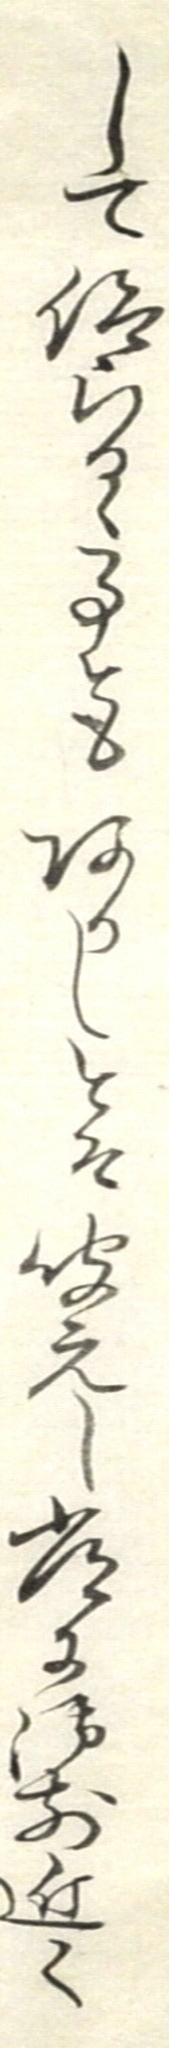して仰らるゝ事ともありしとそ聞えし常に御前近く
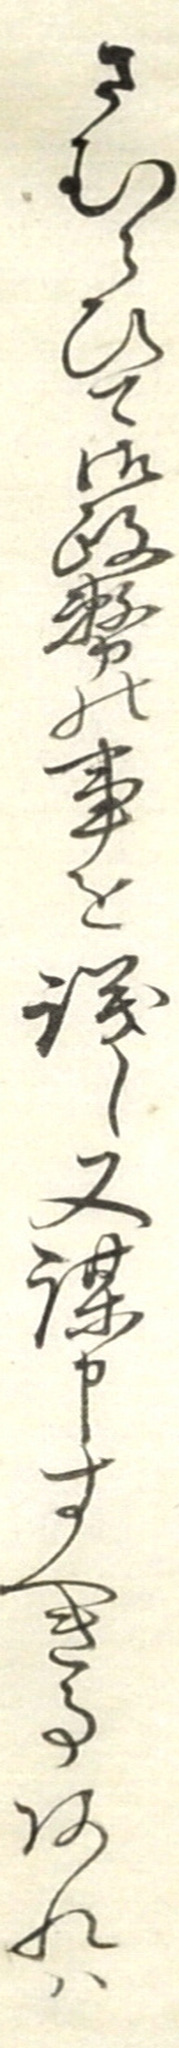さむらひて御政務の事を議し又謀申すへき事あれは
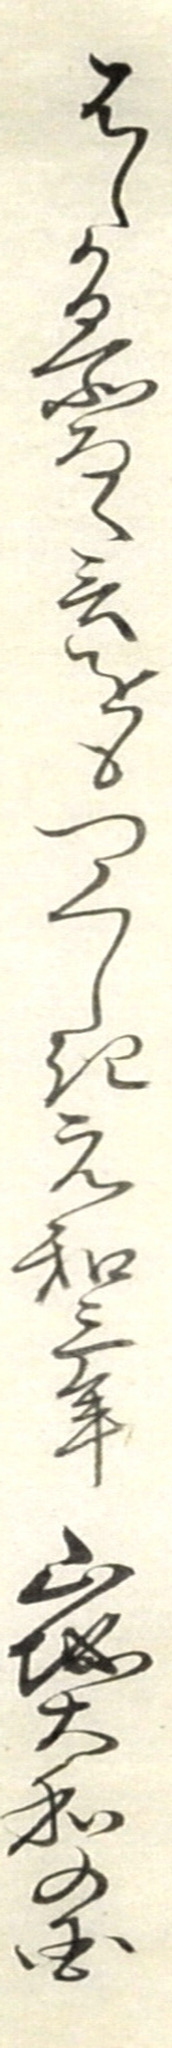はしかる所なく言をもつくしき元和三年山城大和の国

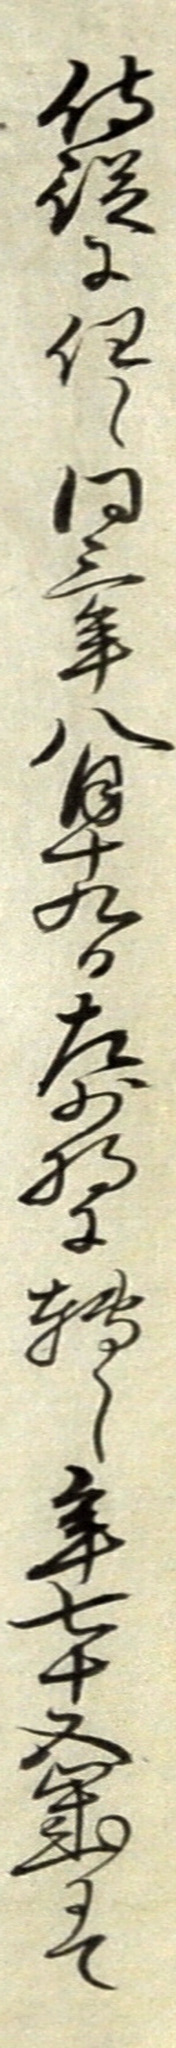侍従に任し同三年八月十九日左少将に転し年七十五歳にて
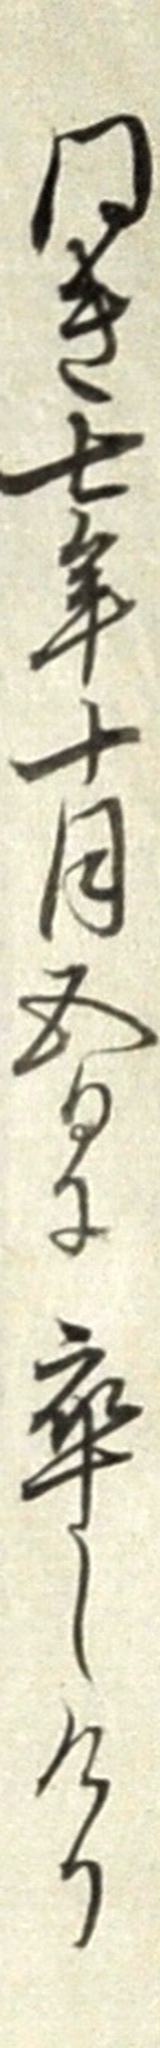同き七年十月五日に卒しけり
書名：藩翰譜（七・下）
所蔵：伊那市立高遠町図書館・合同会社AMANE
